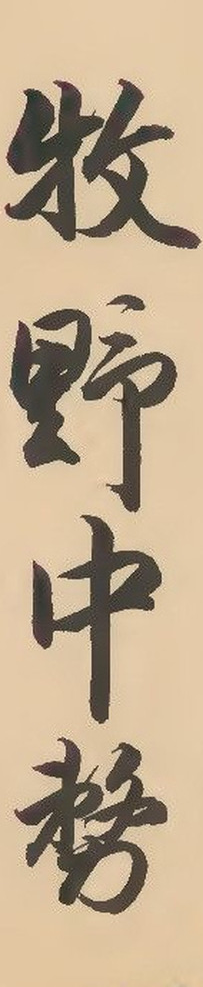牧野中務
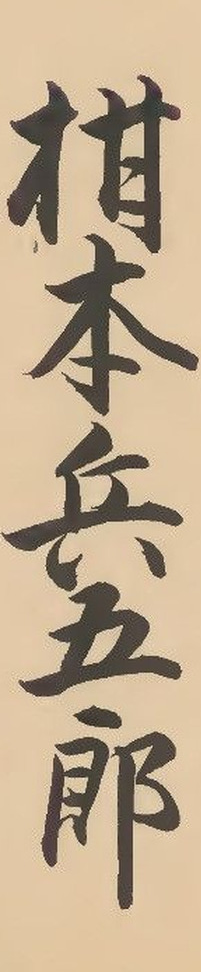柑本兵五郎
